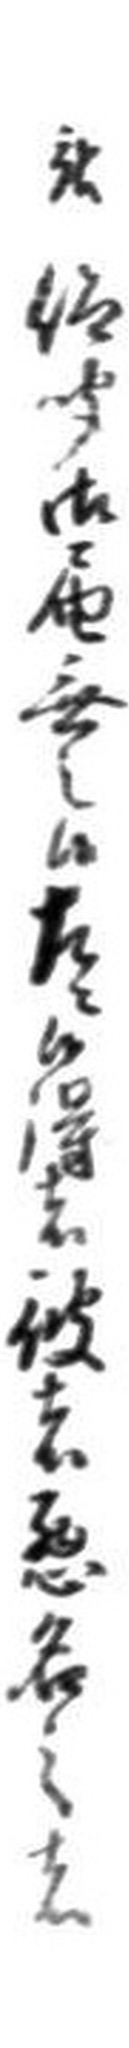被仰聞御届無之候左ニ候得者彼者悪名之者
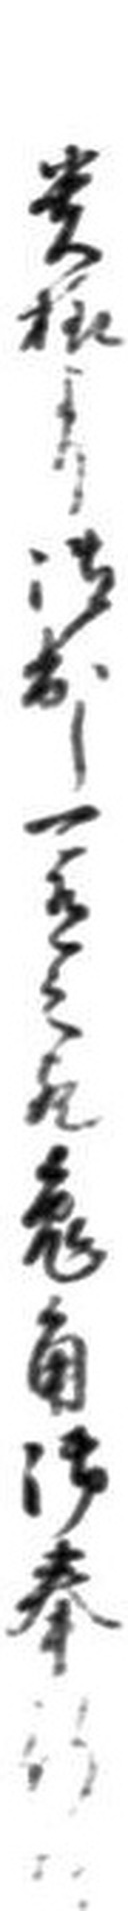貴様より御出し可有之歟兎角御奉行
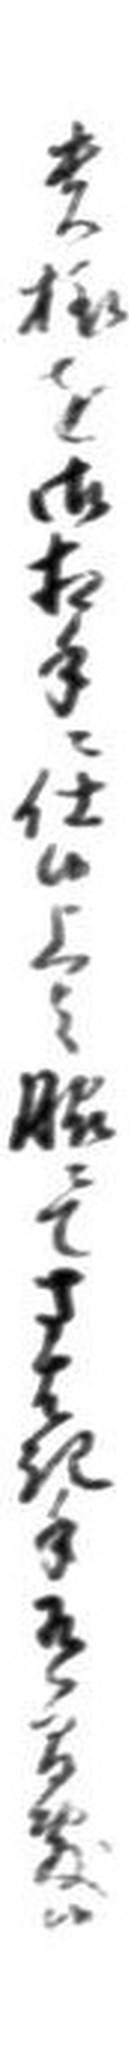貴様を御相手ニ仕候上与脇ニてさはき手有間敷候
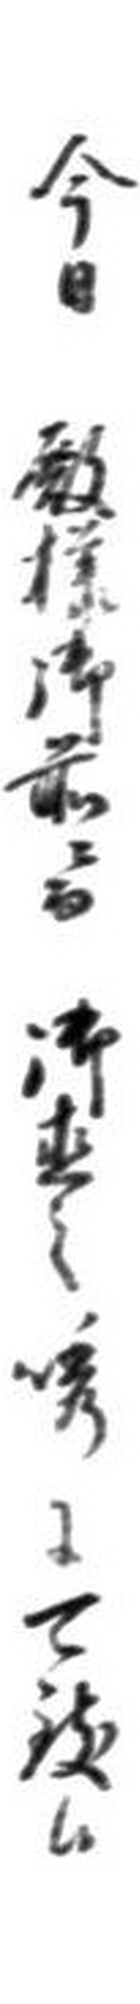今日殿様御前ニ而御直之唀に可致候
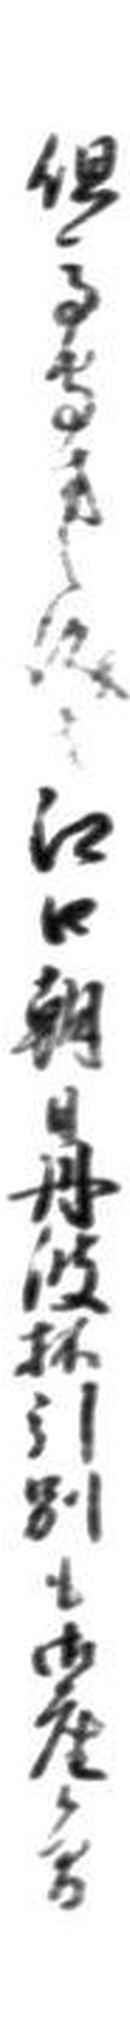但馬守方之儀者江口朝日丹波抔引別も御座候間
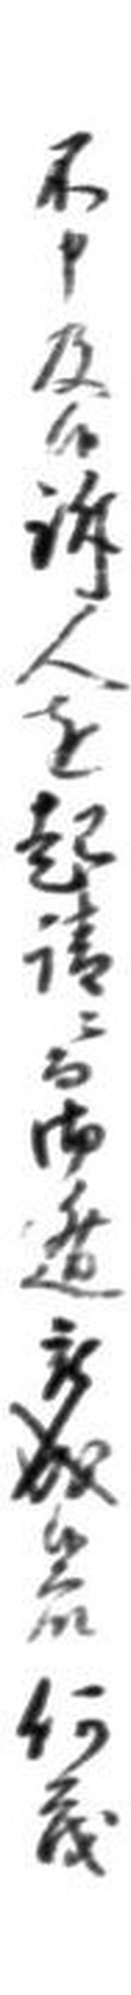不申及候訴人を起請ニ而御遁被成候衆何茂
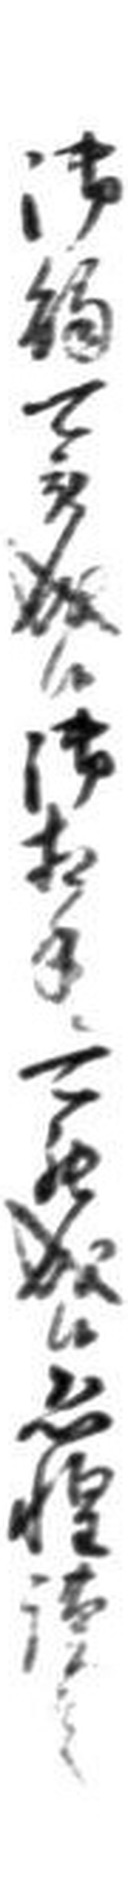御触可被成候御相手ニ可罷成候恐惶謹言
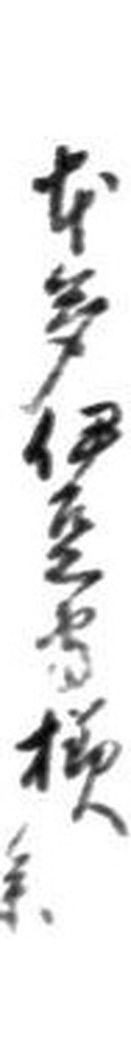本多伊豆守様参

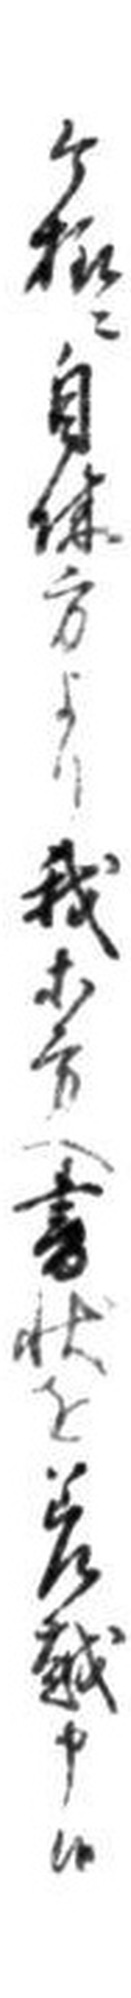ケ様ニ自休方より我等方へ書状を差越申候
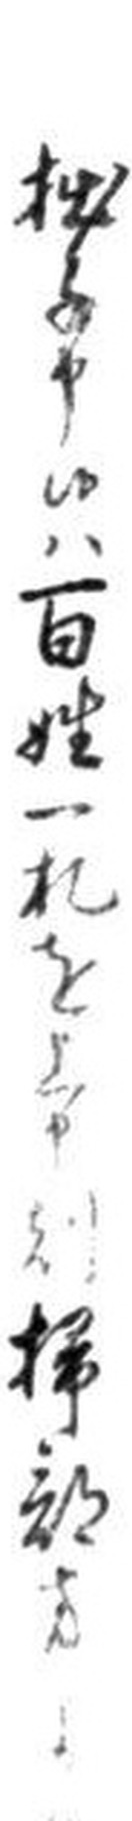拙子申候ハ百姓一札を上申刻掃部方より
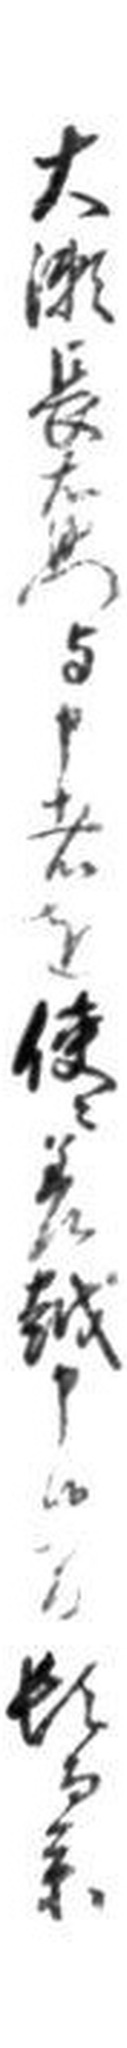大瀬長右衛門与申者を使ニ差越申候間頓而参
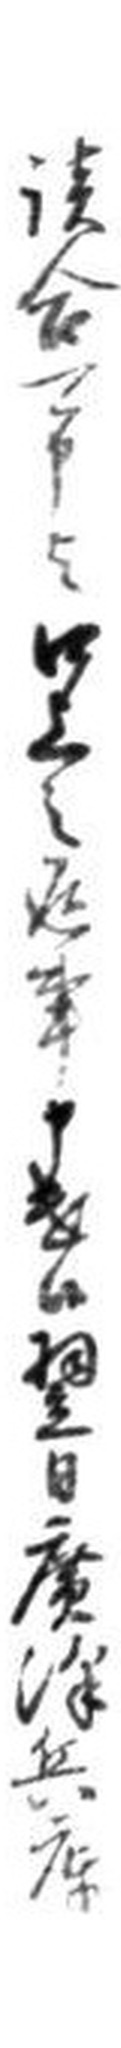請合可申与口上之返事申遣候翌日広沢兵庫
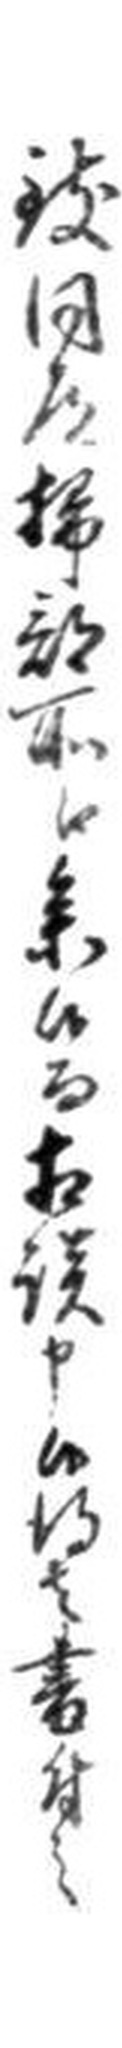致同道掃部所江参候而相談申候得者書付之
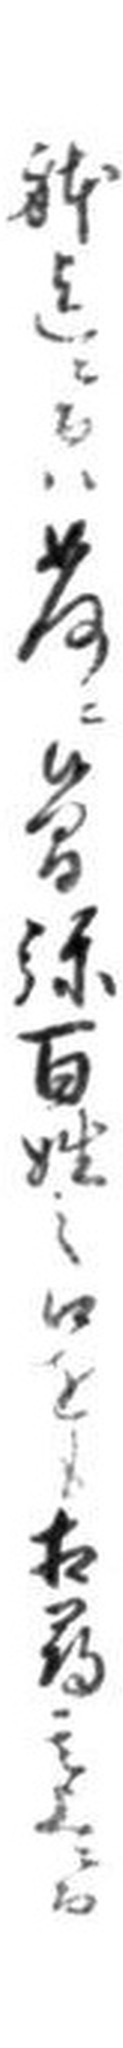躰迄ニ而ハ如何ニ候間弥百姓之口を〆相尋其上ニ而
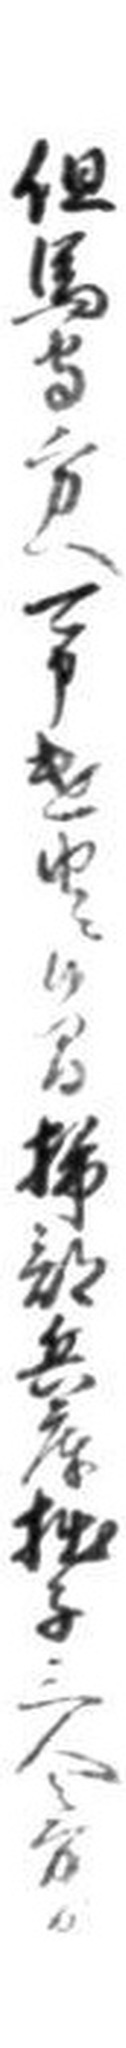但馬守方へ可申遣由ニ候間掃部兵庫拙子三人之方ゟ
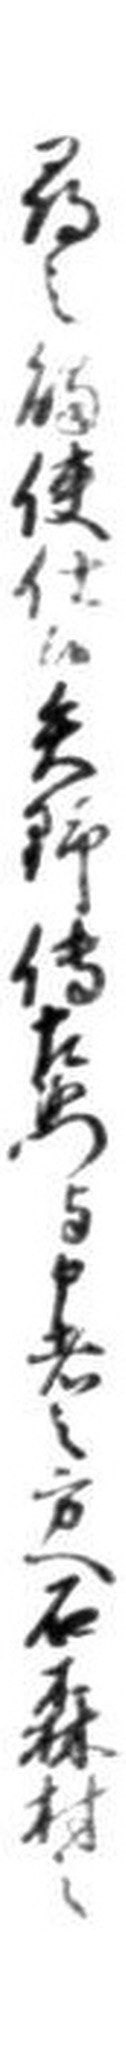尋之触使仕候矢野伝左衛門与申者之方へ石森村之
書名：家譜 二 忠直公 従文禄四年到慶安四年
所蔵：福井県文書館 Fukui Prefectural Archives
